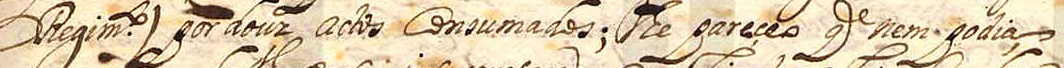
Regim.to) por douz actos Consumados; lhe pareceo q̄ nem podia
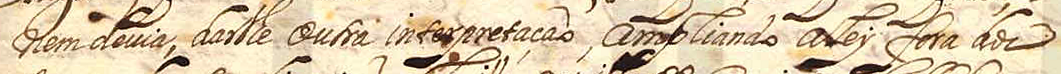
nem deuia, darlhe Outra interpretaçaõ, ampliando a Ley fora aos
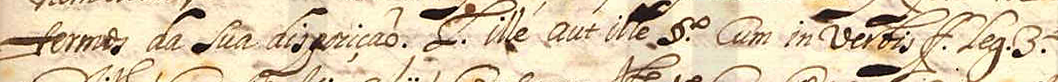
termos da sua dispoziçaõ. P. elle aut ille §.o Cum in verbis ff. Leg. 3.o
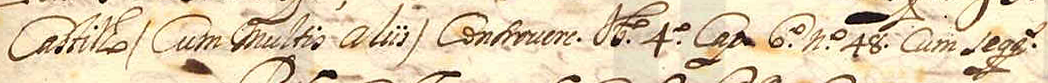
Castilho / Cum multis aliis / Controuerc. ib̄.o 4.o Cap 6.o n.o 48. Cum segg.s
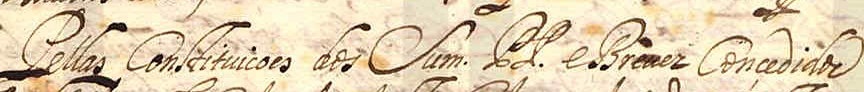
Pellas Constituiçoes dos Sum. PP. e Breuez Concedidos
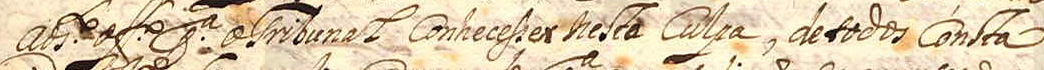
ao s.to off.o p.a o Tribunal Conhecesser nesta Culpa, de todos Consta
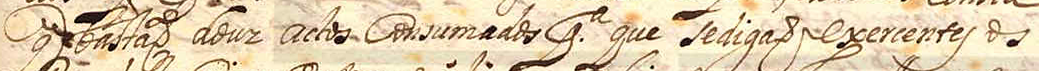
q̄ bastaõ douz actos Consumados p̄.a que se digaõ exercentes os
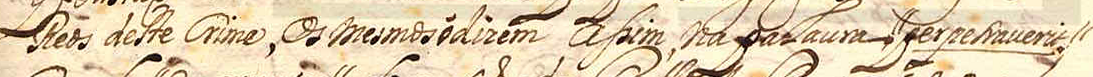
Reos deste Crime, Os mesmos o dizem assim na palaura "perpetrauerit"
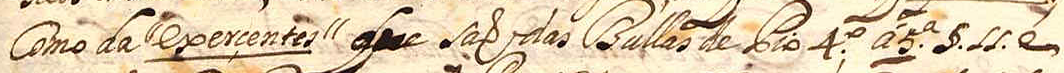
Como da "exercentes" que saõ das Bullas de Pio 4.o á 5.a §. 11 e
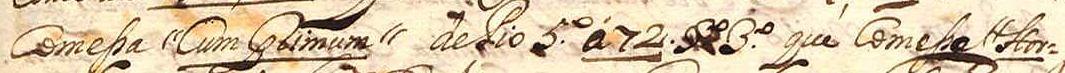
Comessa "Cum primum" de Pio 5.o á 72. _ 3.o que Com esse "Hor
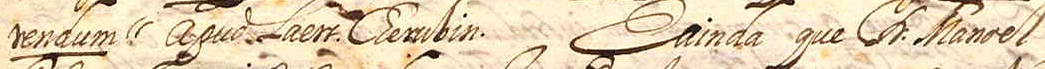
rendum" apud Laert. Cherubin. E ainda que Fr. Manoel
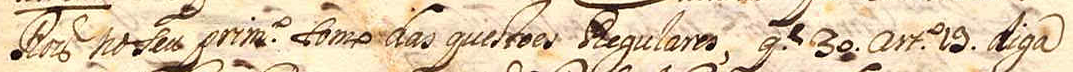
Roze no seu prim.o tomo das questoes Regulares, q.e 30. art.o 19. diga
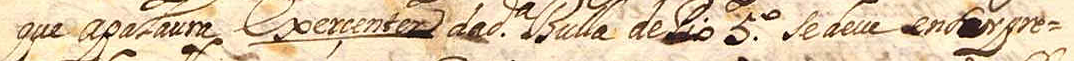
que a palaura Exercentez da d.a Bulla de Pio 5.o se deue enterpre
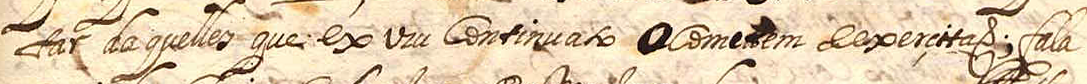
tar daquelles que ex uzu Continuato O comettem e exercitaõ; fala
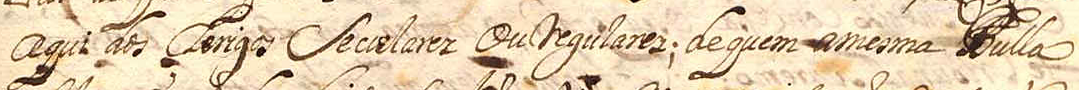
aqui dos Clerigos Secularez ou regularez; de quem a mesma Bulla
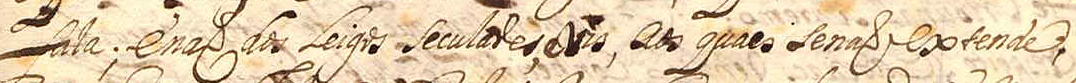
fala; e naõ dos Leigos seculares e vis, aos quaes senaõ extende.
